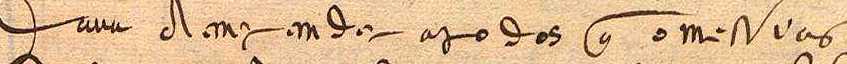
daua A emtemder a todos q̄ o messias
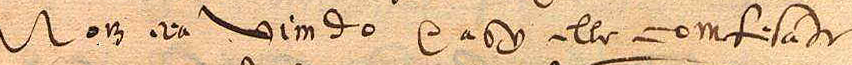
Nom era vimdo e asy elle comfesāte
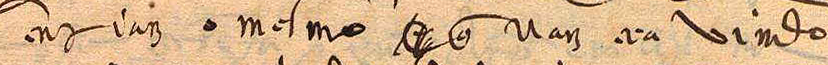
sentiam o mesmo e q̄ nam era vimdo
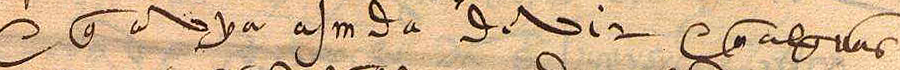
e q̄ avya aJmda de vir e q̄ algūas
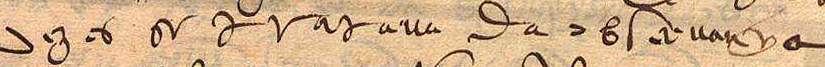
vezes se trataua da obseruanya
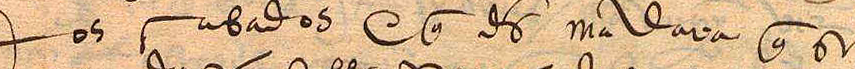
dos sabados e q̄ ds̄ mādava q̄ se
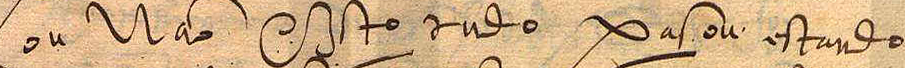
ou Não e Jsto tudo pasou estando
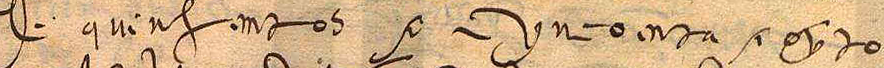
de quinhemtos e cyncoenta e oyto
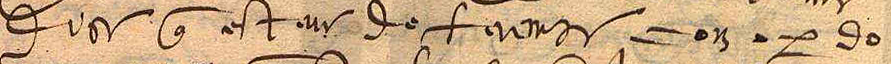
dise q̄ esteue de feremte com o Ldo
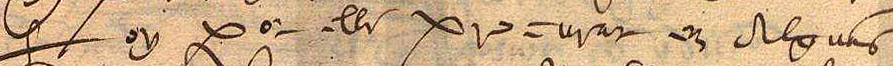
foy por elle procurar em Alguās
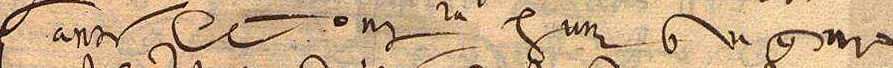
sante e Contra hum seu genro
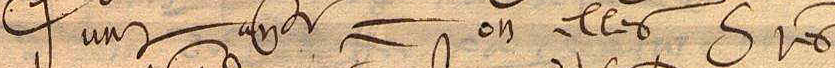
Juntamte Com elles srēs
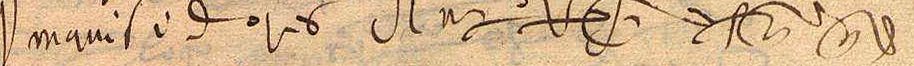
Jmquisidores Anto Rōjz o stp̄vy
